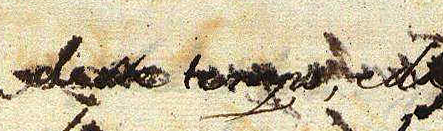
deste tempo, e da
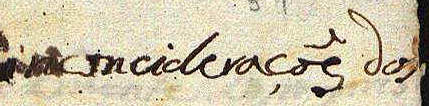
inconcideraçoẽs dos
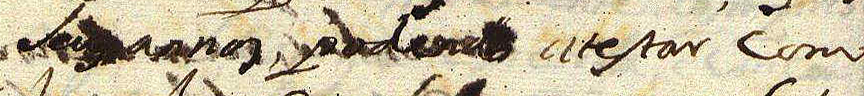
seis annos, podendo atestar com
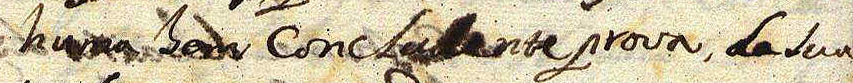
huma bem concludente prova, da sua
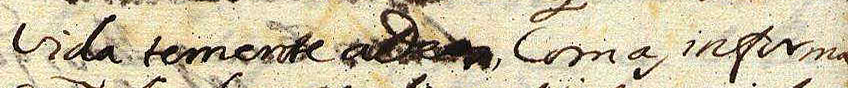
vida temente a De_, Com as informa
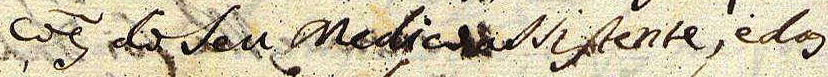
çoẽs do seu Medico assistente, e das
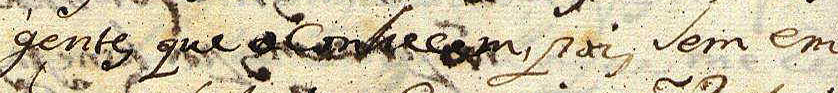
gentes que o conhecem, pois sem em
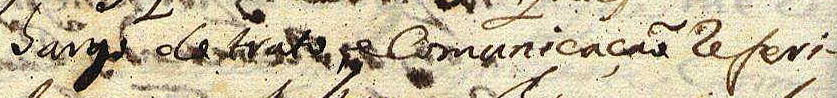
bargo de trato, e comunicaçaõ Referi
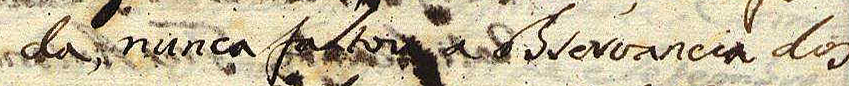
da, nunca faltou a observancia dos
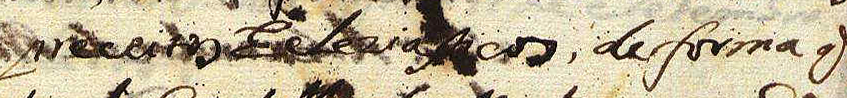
preceitos Ecleziasticos, de forma q̄
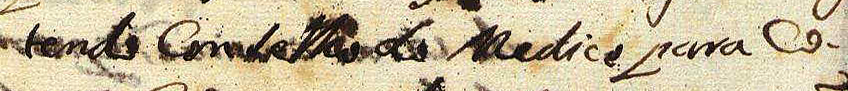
tendo Conselho do Medico para Co
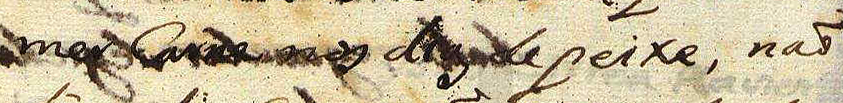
mer Carne nos dias de peixe, naõ
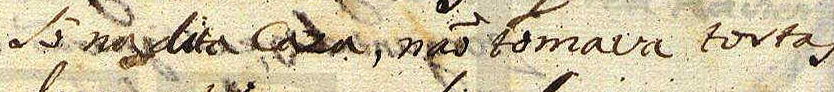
só na dita Caza, naõ tomava tortas
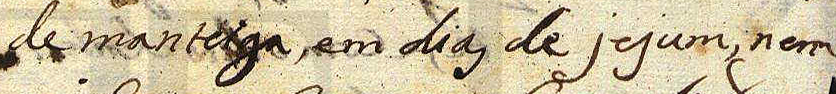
de manteiga, em dias de jejum, nem
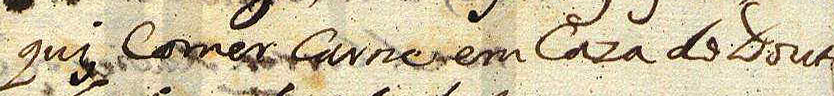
quis Comer Carne em Caza do Dout
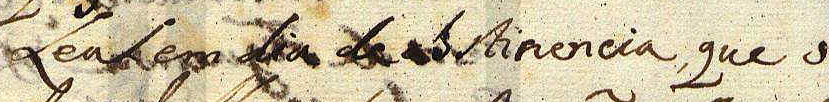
LeaL em dia de abstinencia, que o
